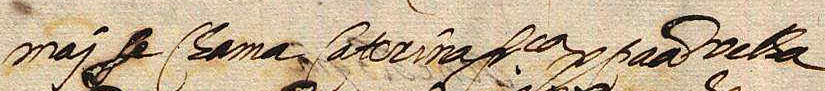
maj se Chama Caterina fr.ca xpaã velha
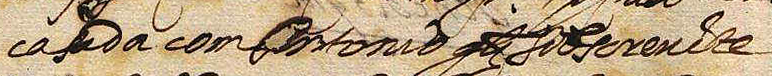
casada com Antonio glz̄ sobscreuēte
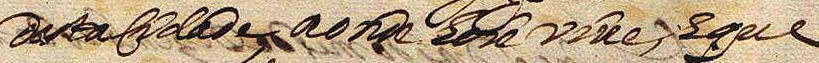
desta Cidade, aonde hoie viue, E que
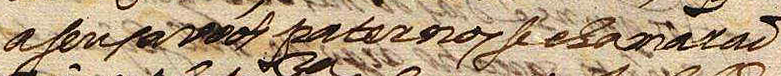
a seus avoos paternos se chamaraõ
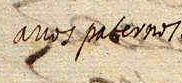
auos paternos.
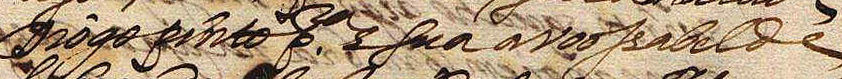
Diogo pinto p.ra E sua avoo Jsabel de
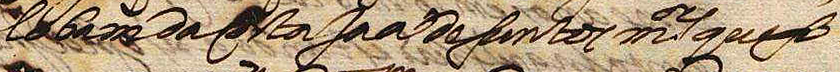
lobam da Costa Jaa defuntos m.ors que fo
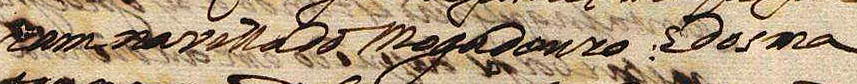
ram na villa do Mogadouro: E dos ma
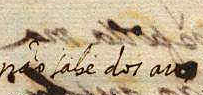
não sabe dos avos
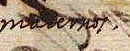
maternos.
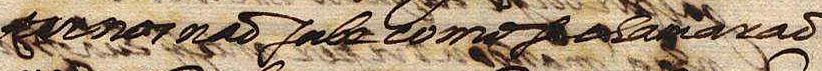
ternos naõ sabe como se chamaraõ
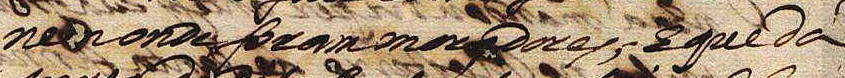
nem onde foram moradores, E que da
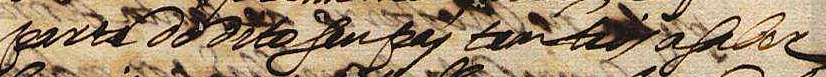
parte do dito seu paj tem tios a saber
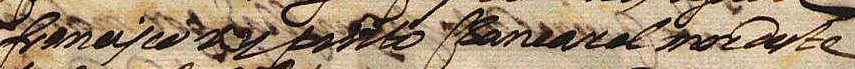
francisco vaz pinto Chancarel mor deste
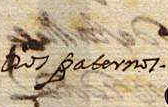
tios paternos.
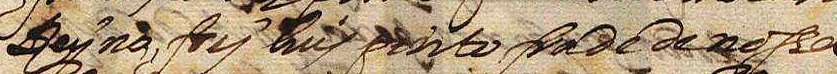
Reyno, frej luis pinto frade de nossa
